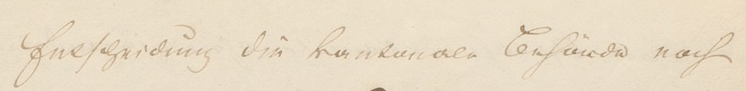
Entscheidung die kantonale Behörde noch
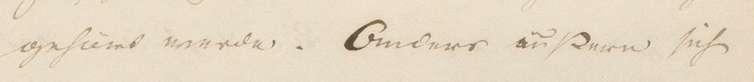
gehört werde. Anders äußere sich
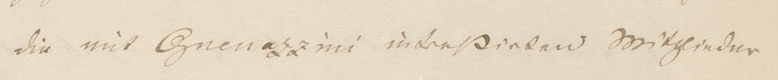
die mit Gnenazzini intreßirten Mitglieder
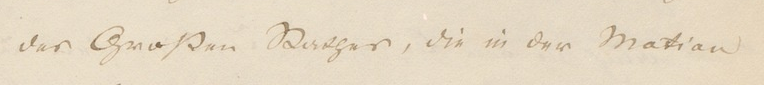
des Großen Rathes, die in der Motion
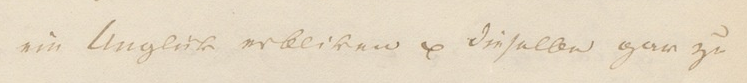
ein Unglük erbliken & dieselbe gar zu
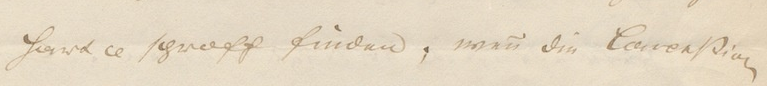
hart und schroff finden; wenn die Conceßion
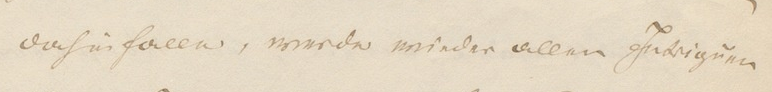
dahinfalle, werde wieder allen Intriguen
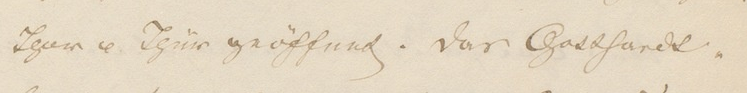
Thor & Thür geöffnet. Das Gotthardt -
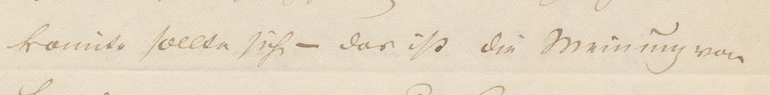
komite sollte sich – das ist die Meinung von
